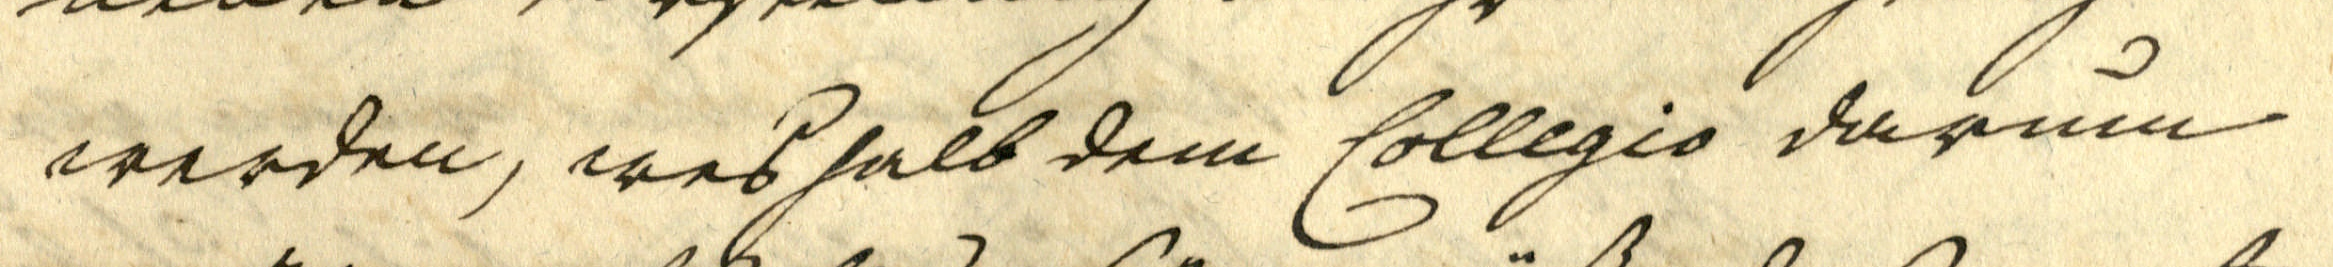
werden, wes halb dem Collegio darum
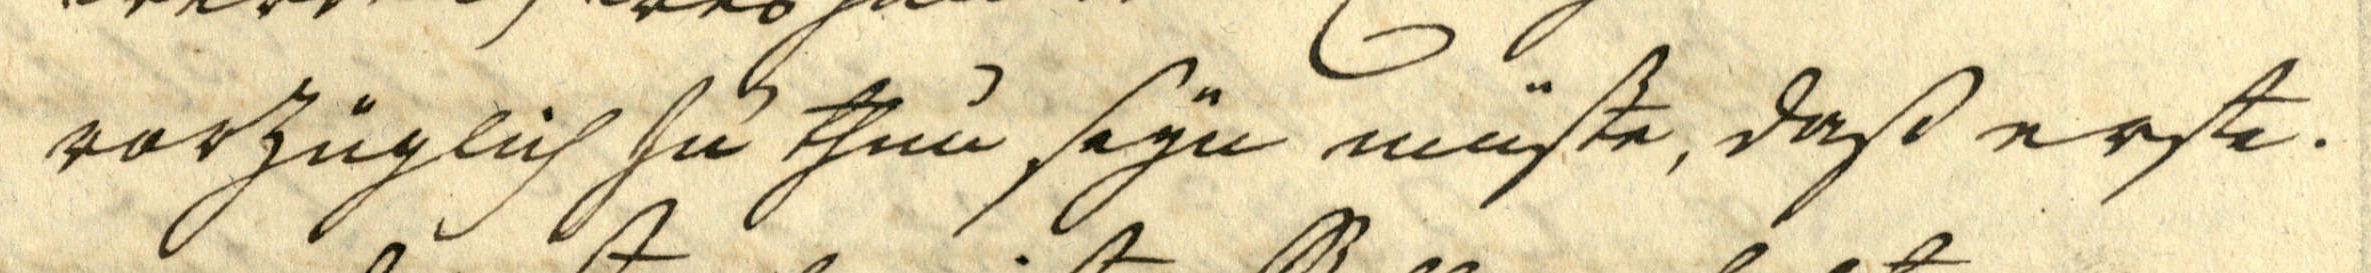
vorzüglich zu thun seÿn müßte, daß erste¬
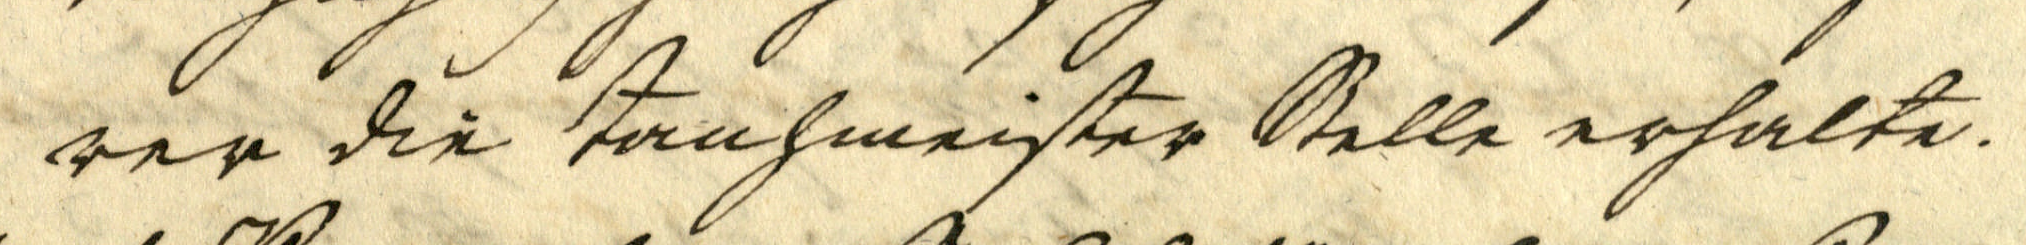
rer die Tanzmeister Stelle erhalte.
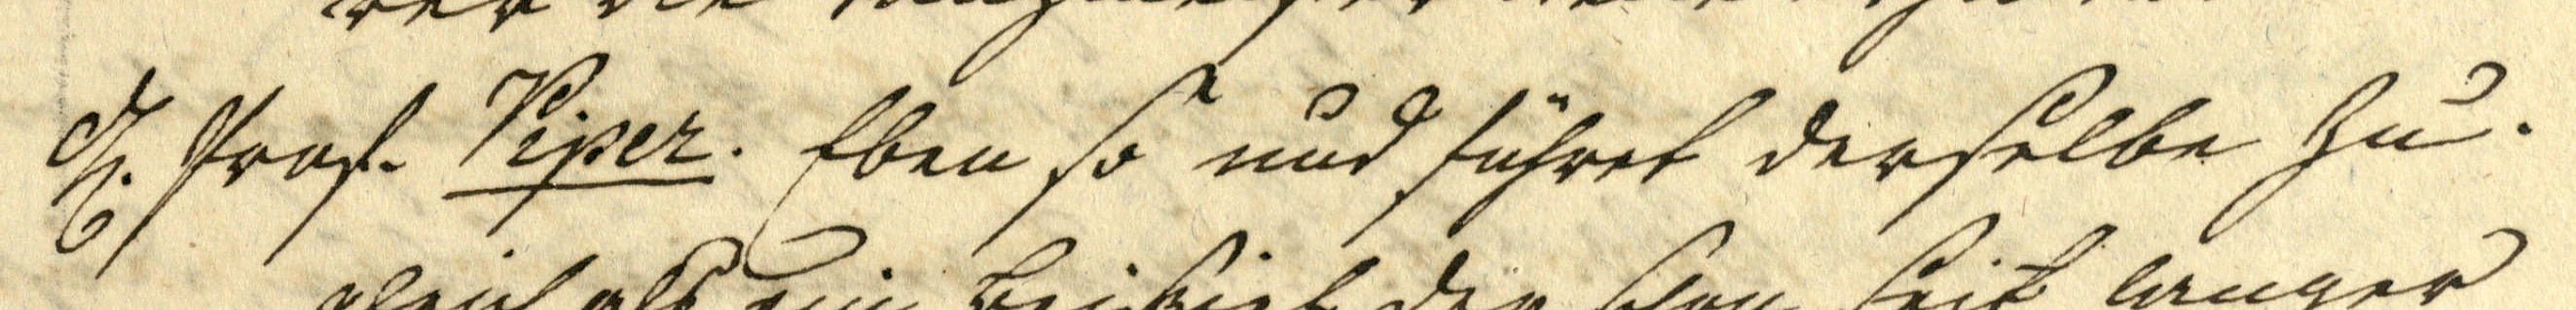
dh. Prof. Piper. Eben so und führet derselbe zu-
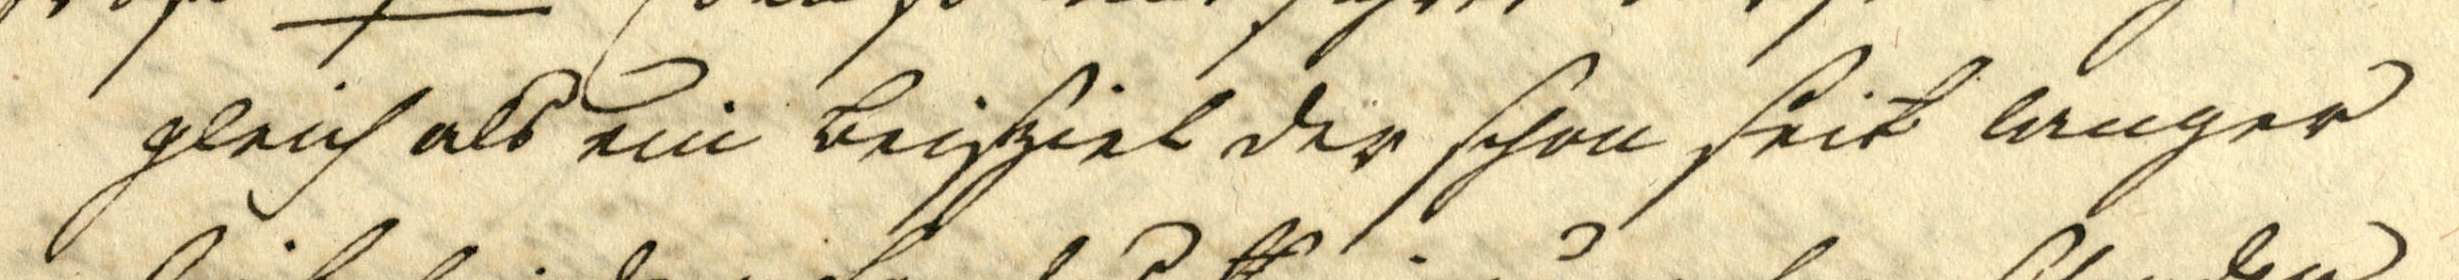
gleich als ein Beispiel der schon seit langer
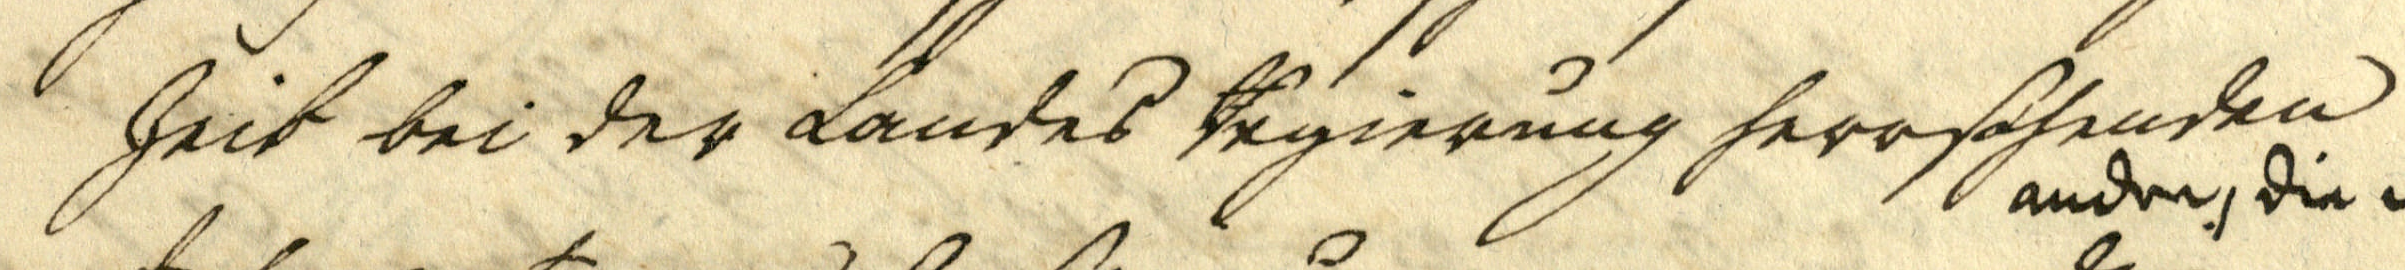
Zeit bei der Landes Regierung herrschenden
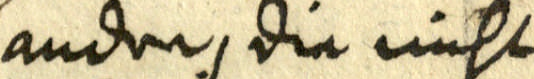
andere, die nicht
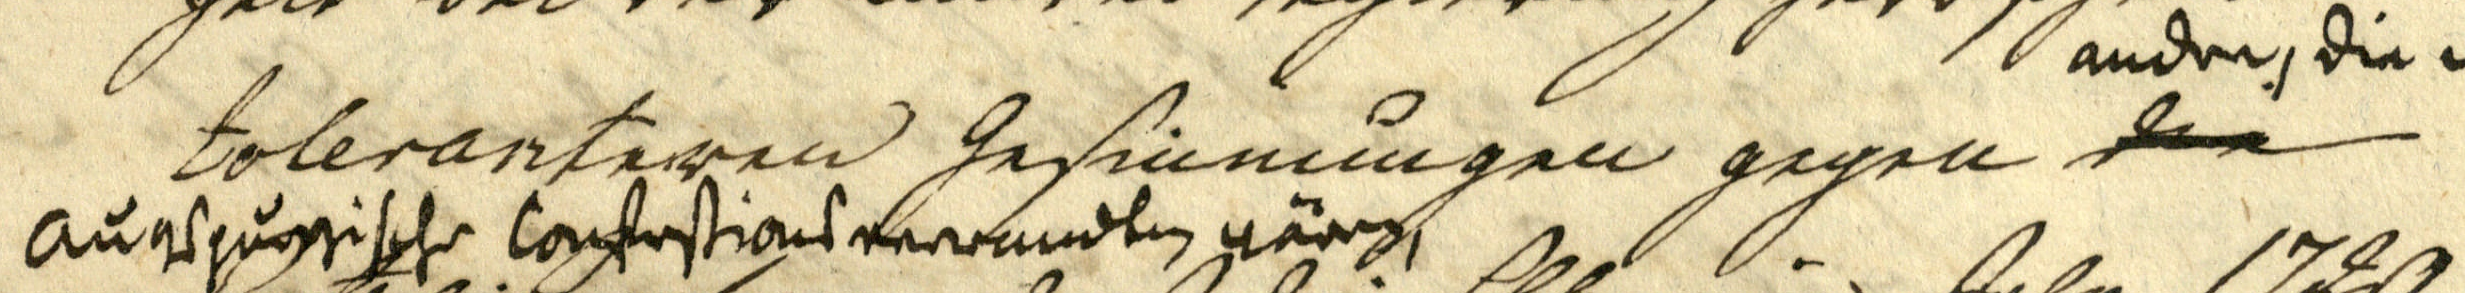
toleranteren Gesinnungen gegen den
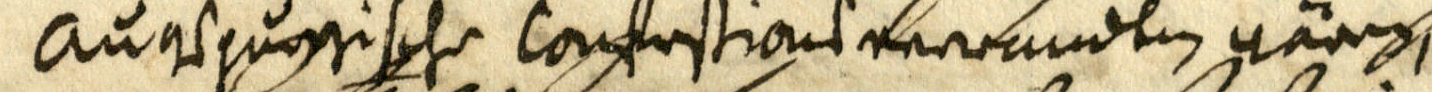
Augsburgische Confessionsverwandte wären,
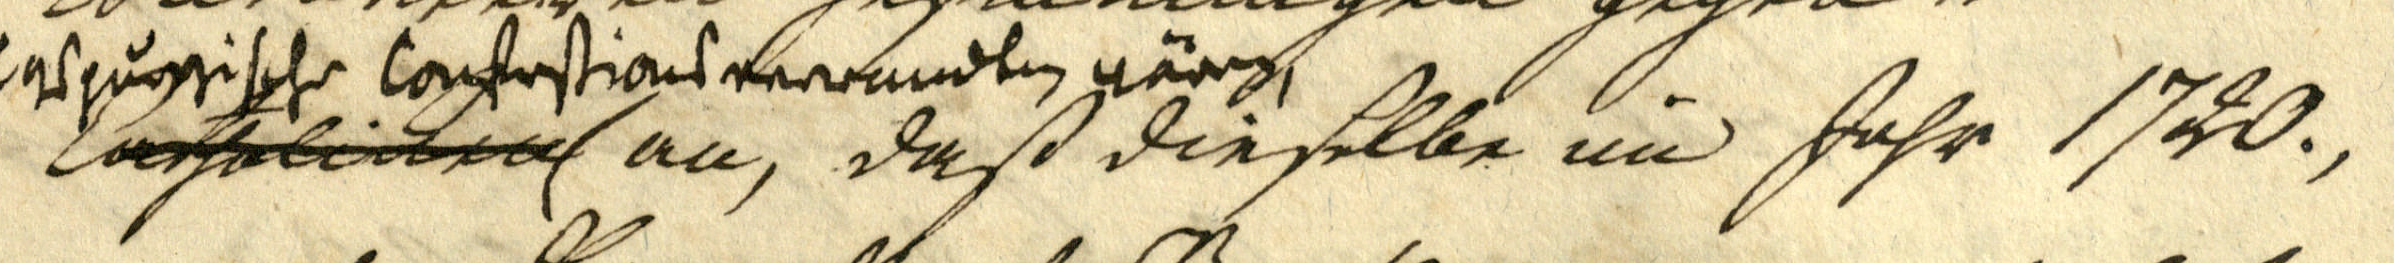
Catholiken an, daß dieselbe im Jahr 1720.,
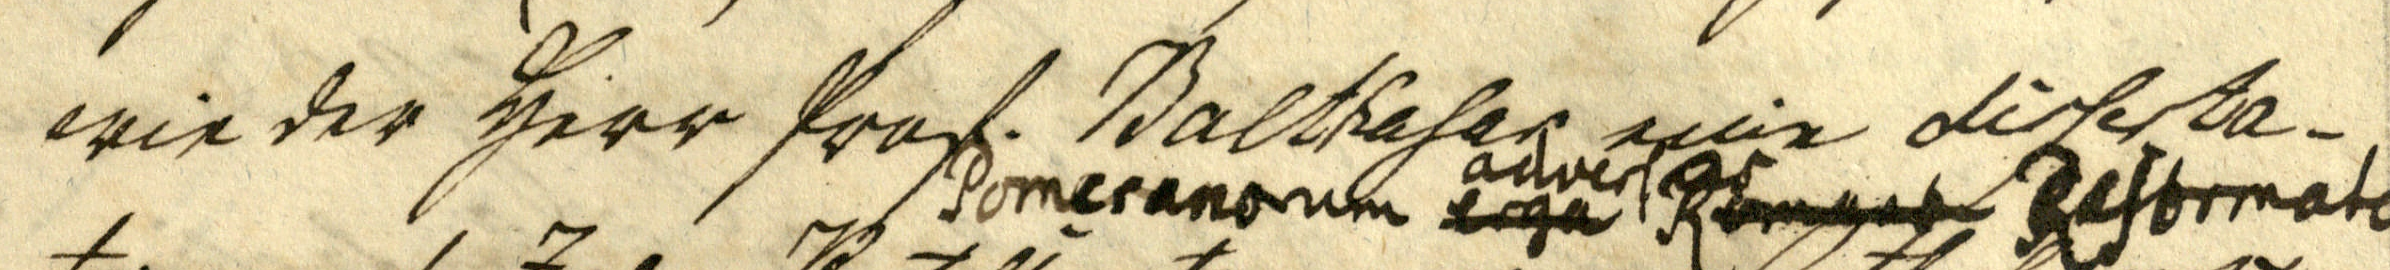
wie der Herr Prof. Balthasar eine disserta¬
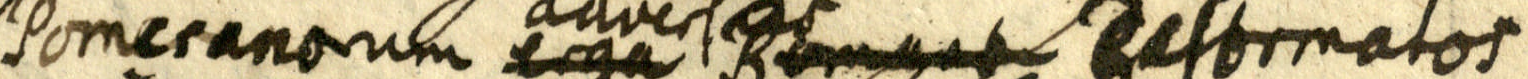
Pomeranorum adversos Reformatos
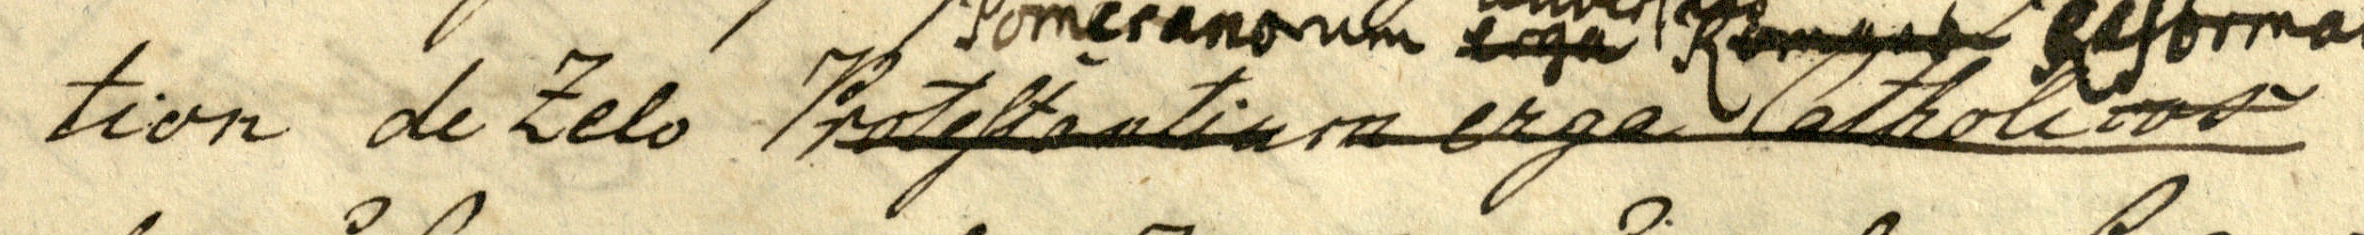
tion de Zelo Protestantium ergo Catholicos
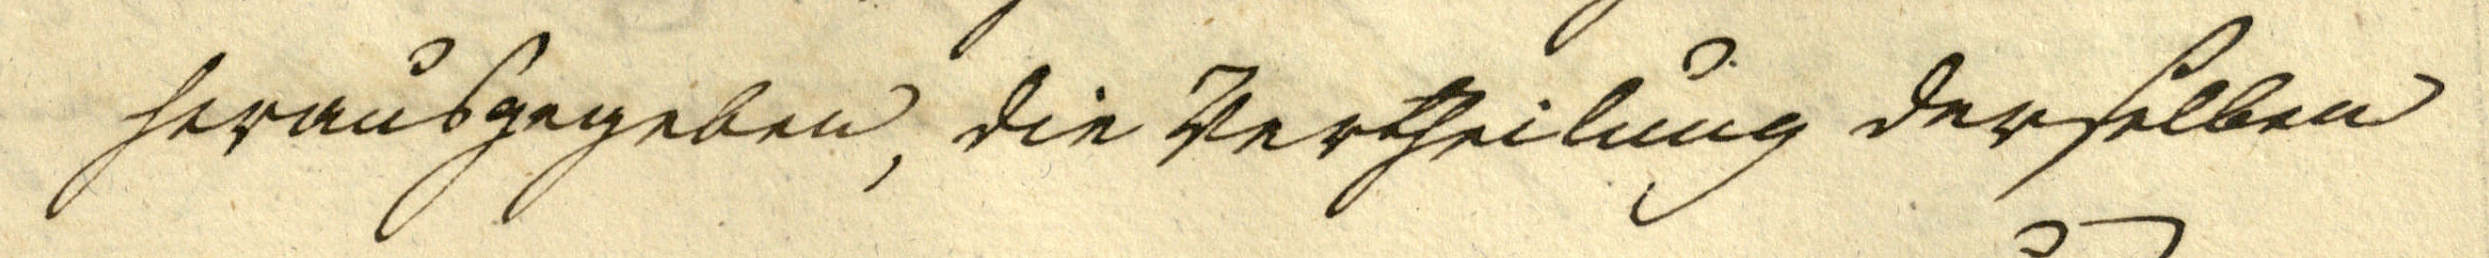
herausgegeben, die Vertheilung derselben
